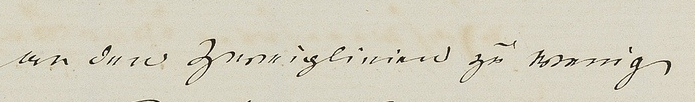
an den Zweiglinien zu wenig
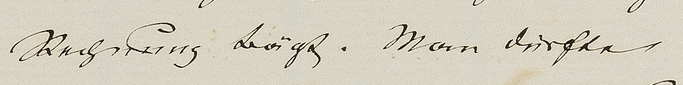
Rechnung trägt. Man dürfte
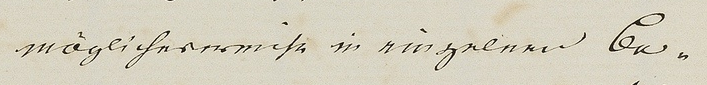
möglicherweise in einzelnen Be-
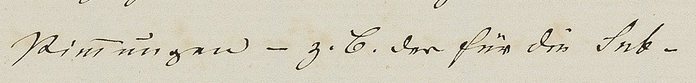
stimmungen – z. B. der für die Sub-
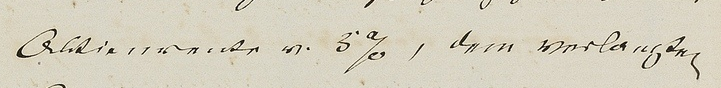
Aktienrente v. 3%, dem verlangten
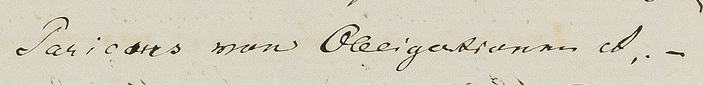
Paricurs von Obligationen ct,. –
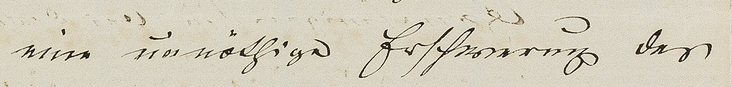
eine unnöthige Erschwerung des
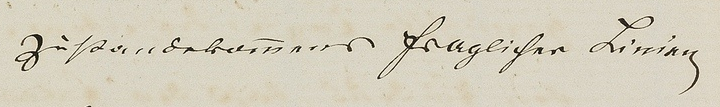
Zustandekommens fraglicher Linien
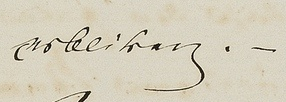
erbliken. –
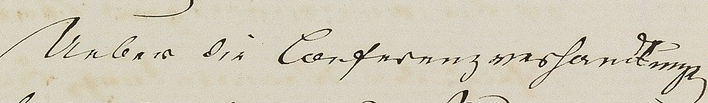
Ueber die Conferenzverhandlungen
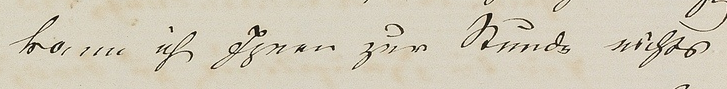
kann ich Ihnen zur Stunde nichts
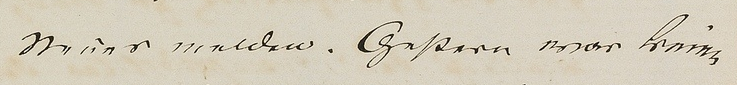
Neues melden. Gestern war keine
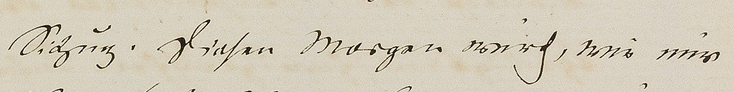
Sitzung. Diesen Morgen wird, wie mir
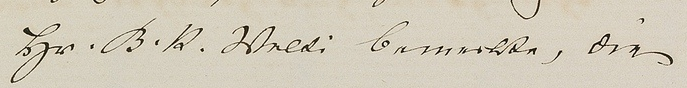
Hr. B.R. Welti bemerkte, die
